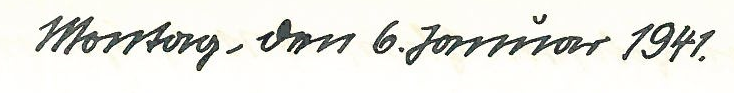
Montag, den 6. Januar 1941.
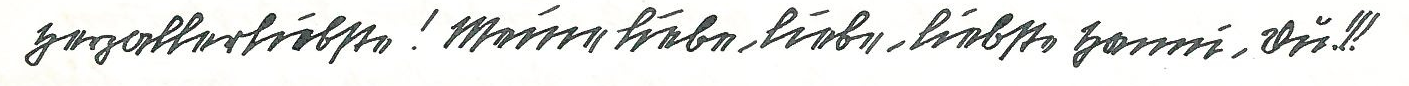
Herzallerliebste! Meine liebe, liebe, liebste, Du!!!
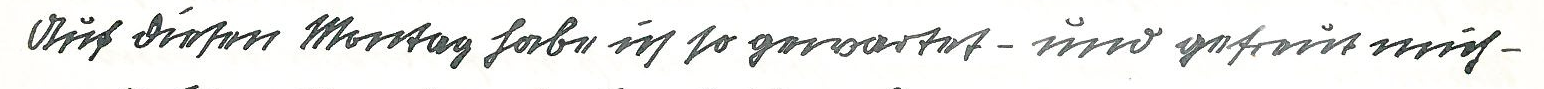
Auf diesen Montag habe ich so gewartet – und gefreut mich –
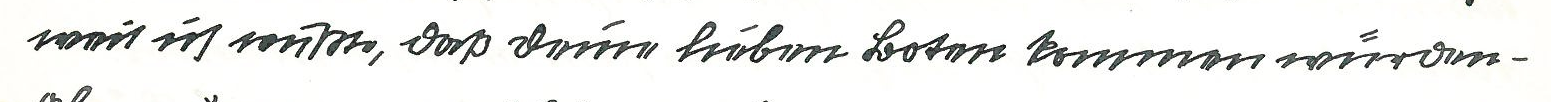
weil ich wußte, daß Deine lieben Boten kommen würden –
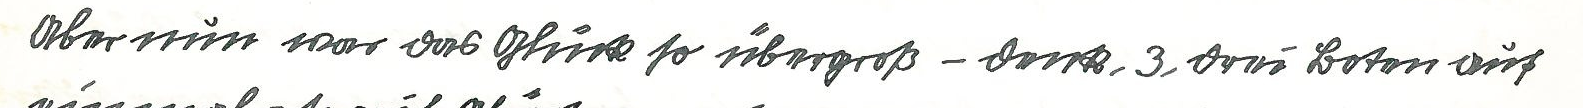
Aber nun war das Glück so übergroß – denk, 3, drei Boten auf
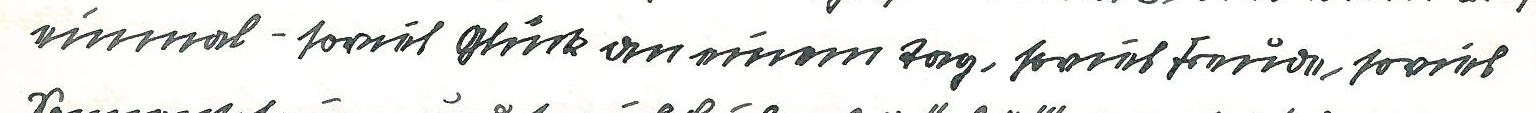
einmal – soviel Glück an einem Tag, soviel Freude, soviel
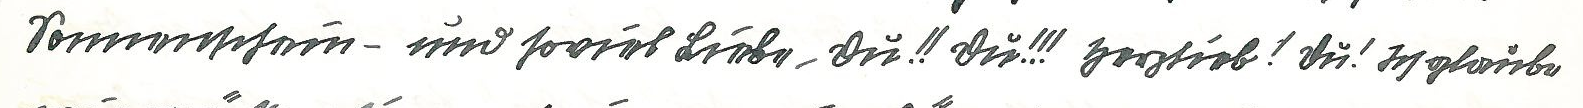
Sonnenschein – und so viel Liebe, Du!! Du!!! Herzlieb! Du! Ich glaube
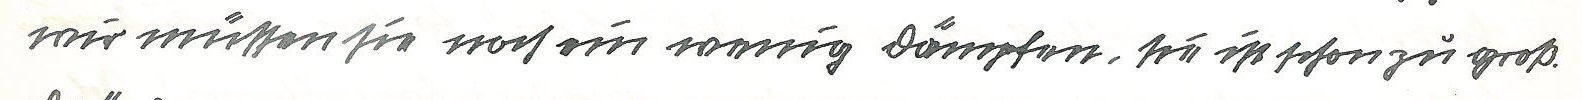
wir müssen sie noch ein wenig dämpfen, sie ist schon zu groß.
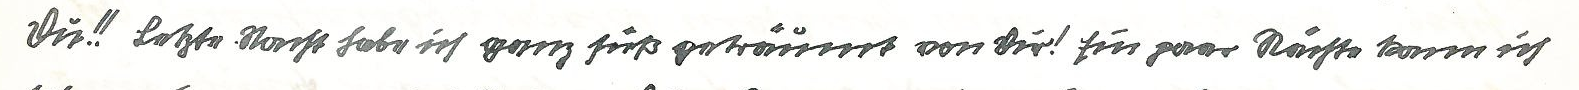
Du!! Letzte Nacht habe ich ganz süß geträumt von Dir! Ein paar Nächte kann ich
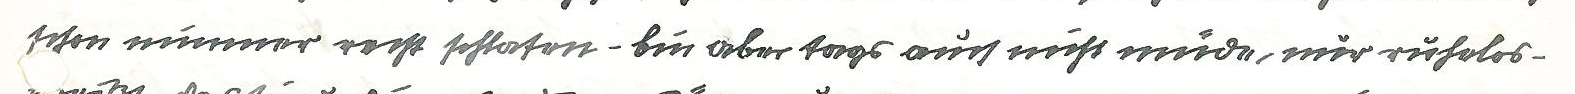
schon nimmer recht schlafen – bin aber tags auch nicht müde, nur ruhelos –
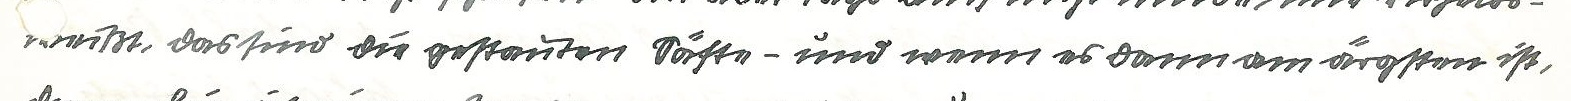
weißt, das sind die gestauten Säfte – und wenn es dann am ärgsten ist,
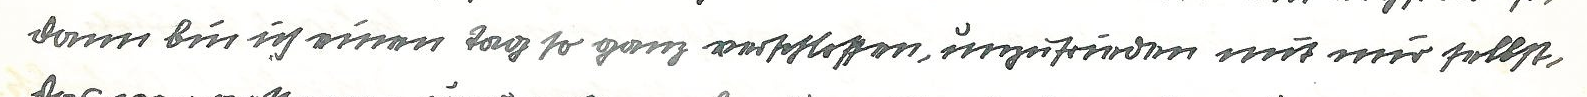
dann bin ich einen Tag so ganz verschlossen, unzufrieden mit mir selbst,
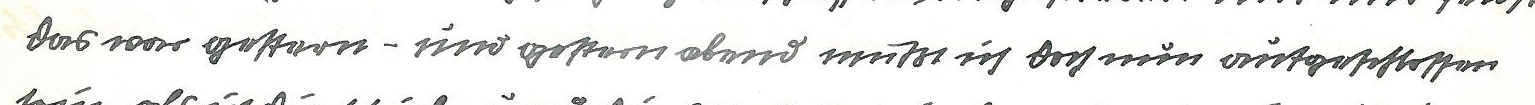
das war gestern – und gestern abend mußt ich doch nun aufgeschlossen
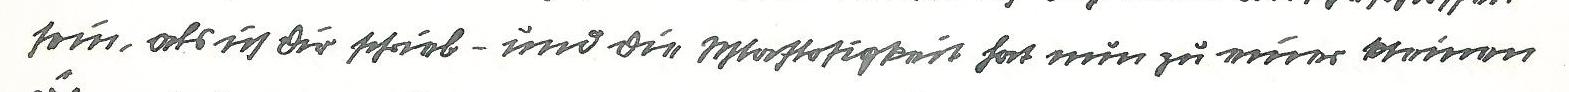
sein, als ich Dir schrieb – und die Schlaflosigkeit hat nun zu einer kleinen
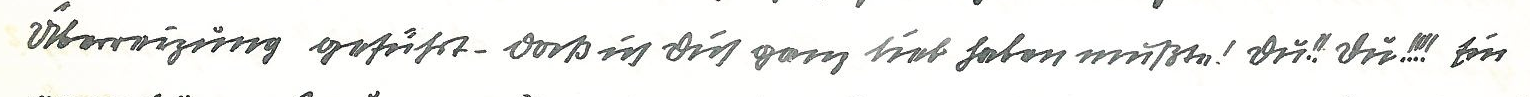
Überreizung geführt – daß ich Dich ganz lieb haben mußte! Du!! Du!!!! Ein
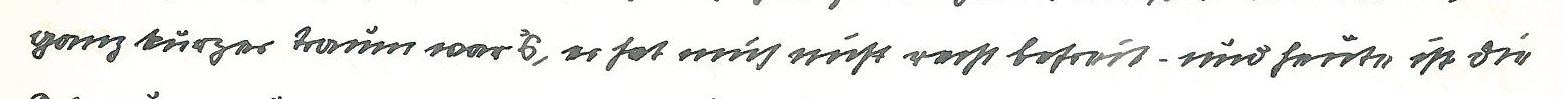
ganz kurzer Taum war’s, er hat mich nicht recht befreit – und heute ist die
